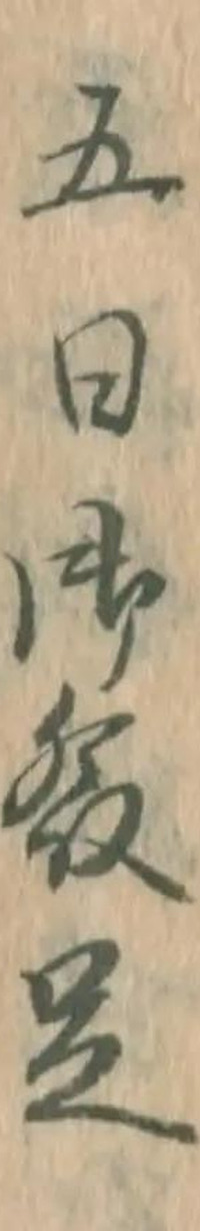五日御発足

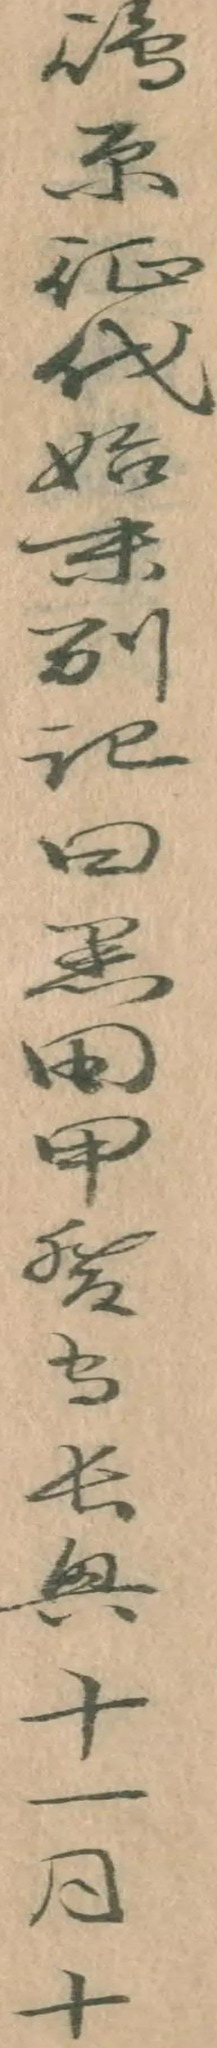島原征伐始末別記曰黒田甲斐守長興十一月十
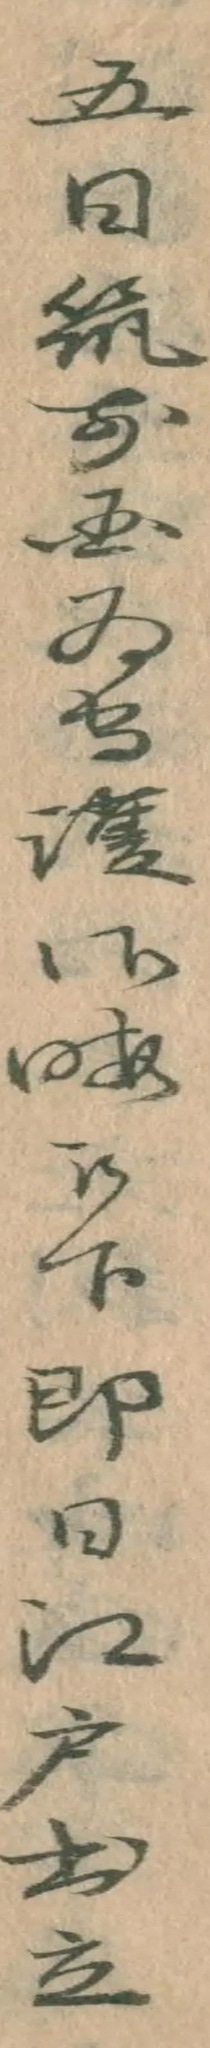五日筑前国為守護御暇被下即日江戸出立
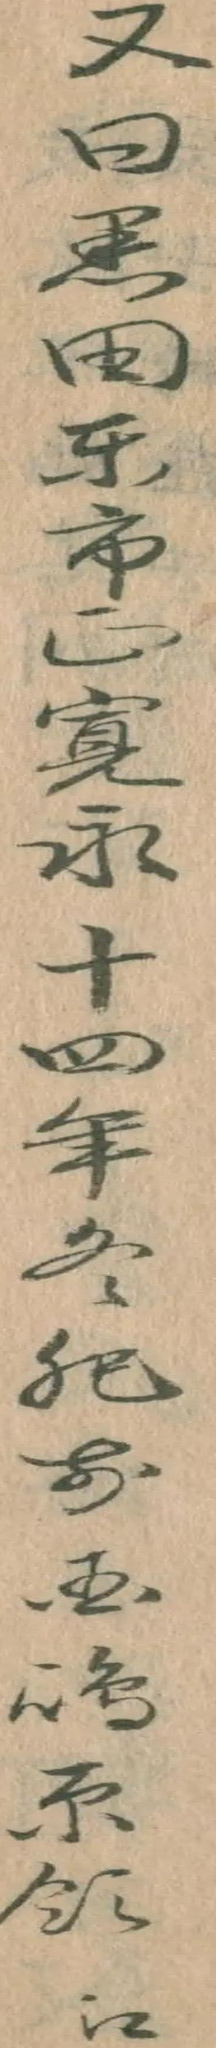又曰黒田東市正寛永十四年冬肥前国島原領江
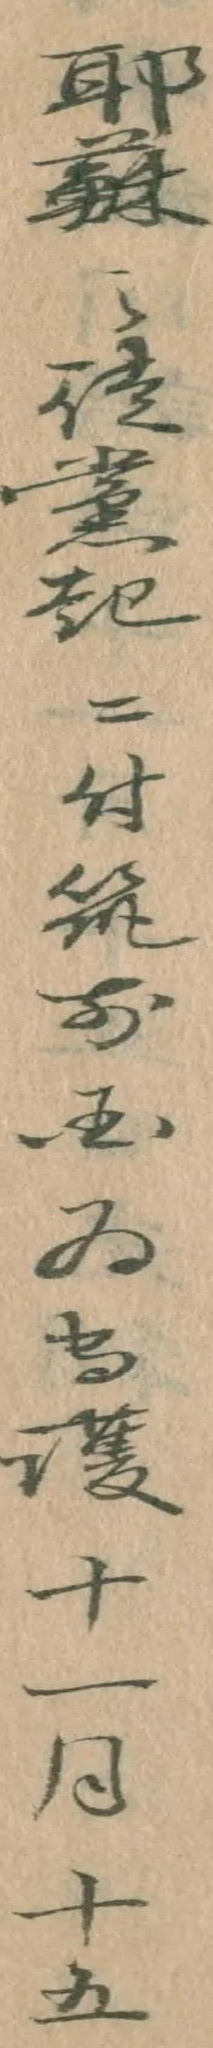耶蘇之徒党起に付筑前国為守護十一月十五
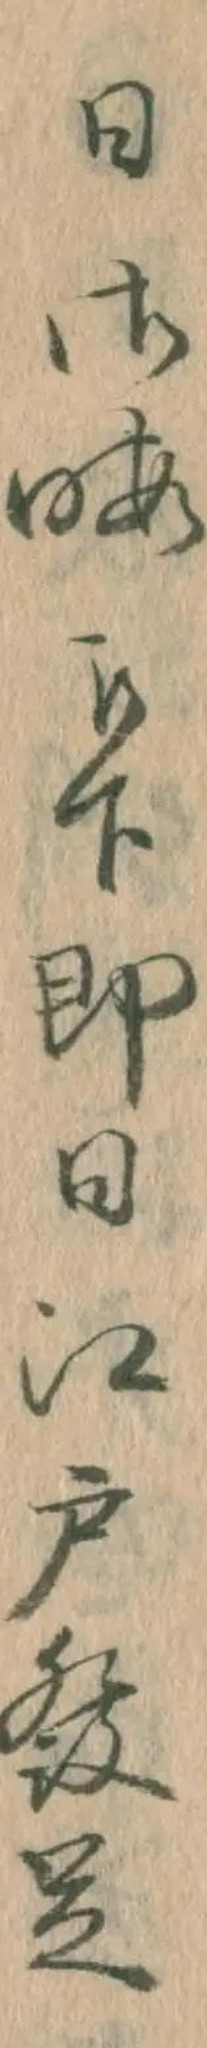日御暇被下即日江戸発足
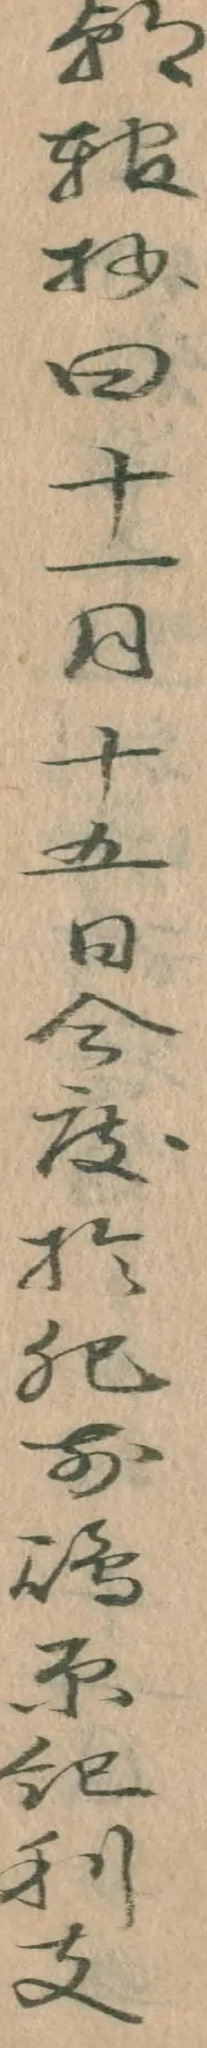朝報抄曰十一月十五日今度於肥前島原紀利支
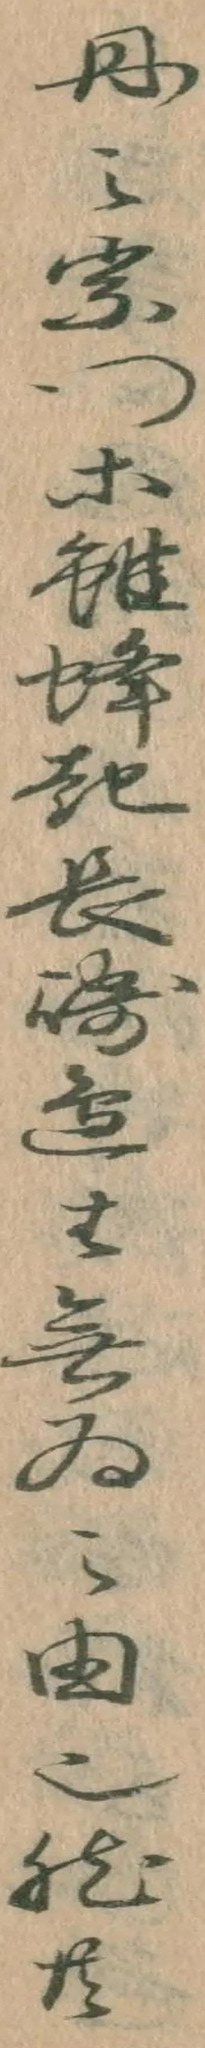丹之宗門等雖蜂起長崎辺は無為之由也然共
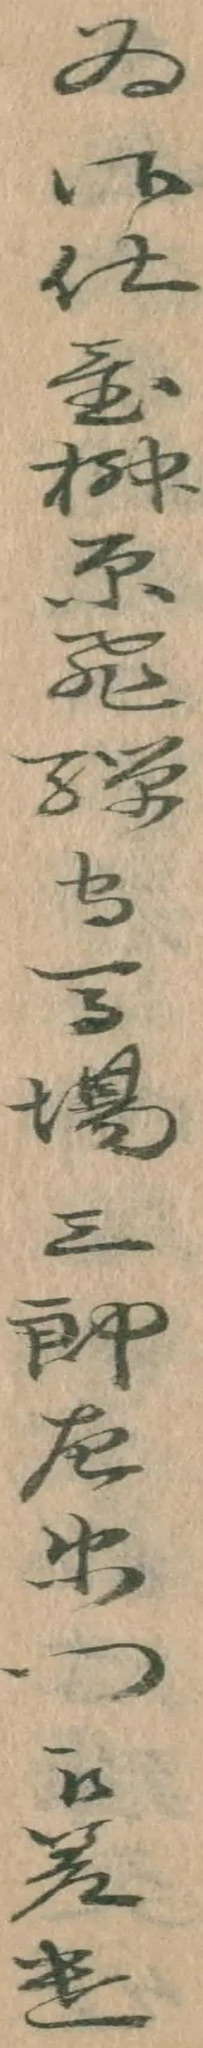為御仕置榊原飛騨守馬場三郎左衛門被差遣
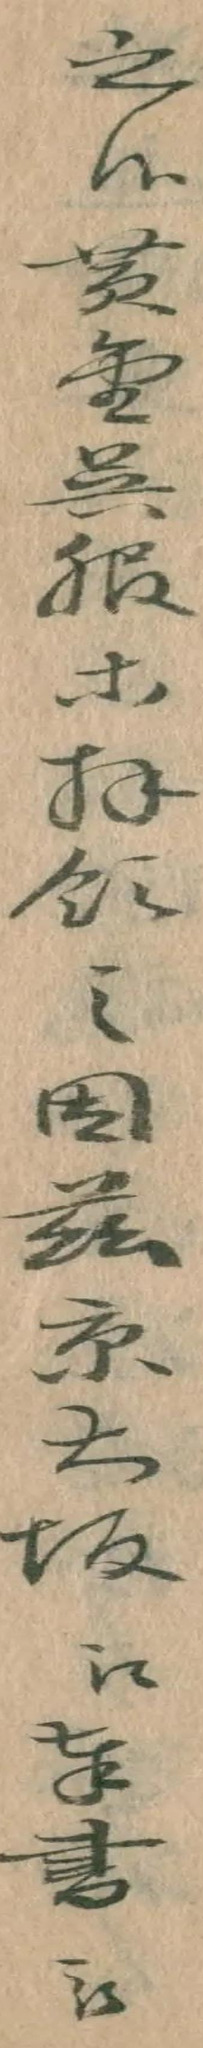之候黄金呉服等拝領之因茲京大坂江奉書被
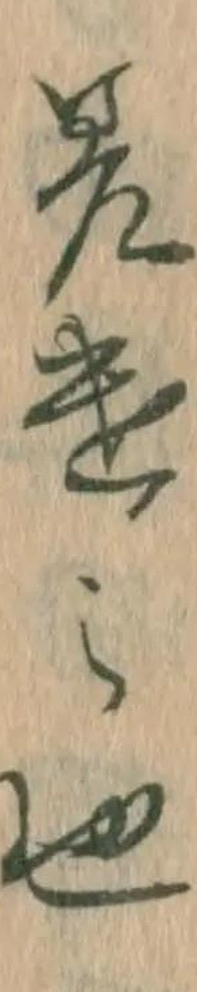差遣之也
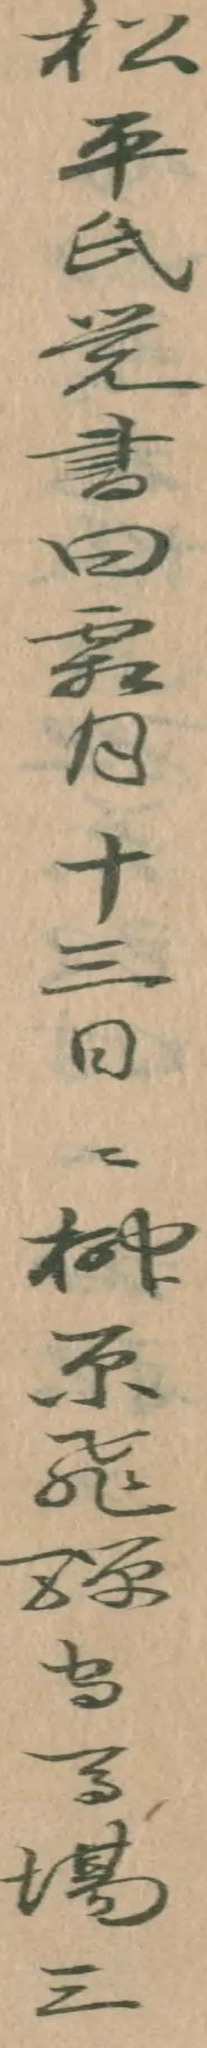松平氏覚書曰霜月十三日に榊原飛騨守馬場三
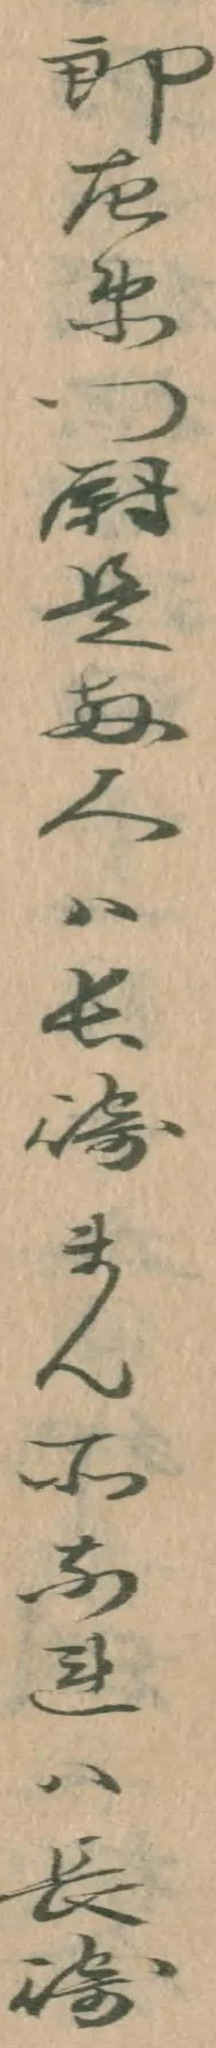郞左衛門尉是両人は長崎まん所なれは長崎
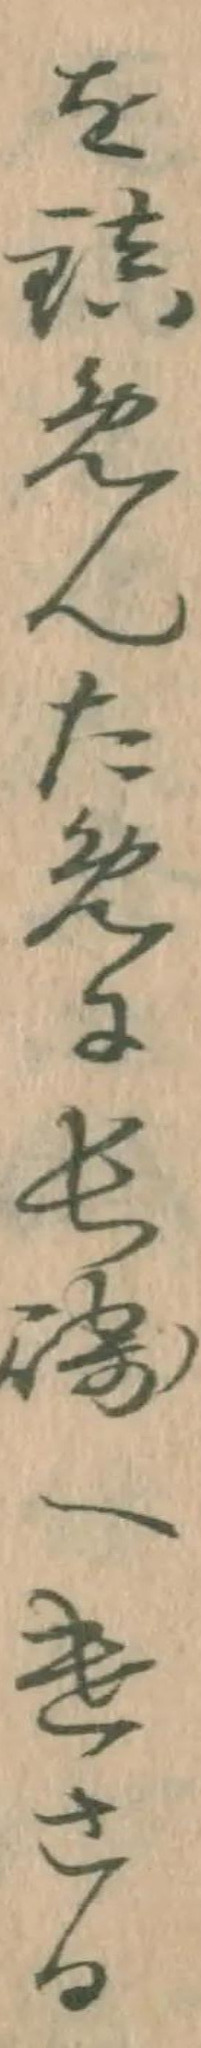を鎮めんために長崎へ遣さる
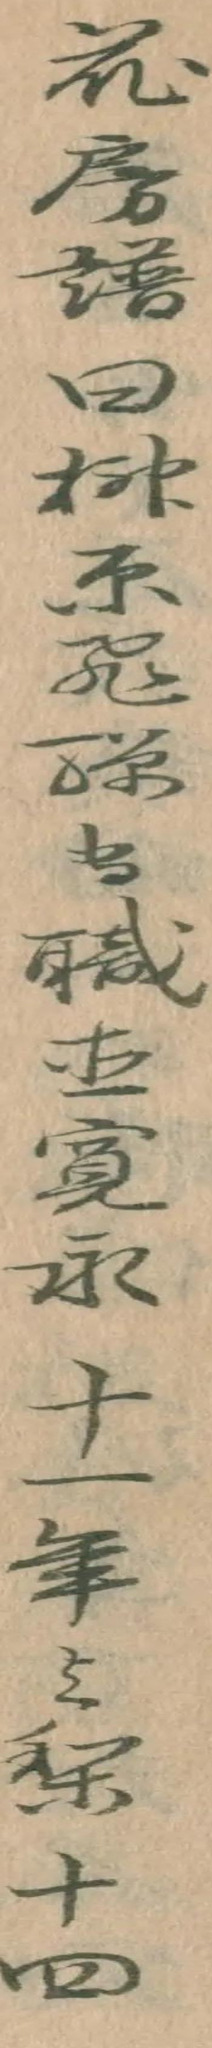花房譜曰榊原飛騨守職直寛永十一年より十四
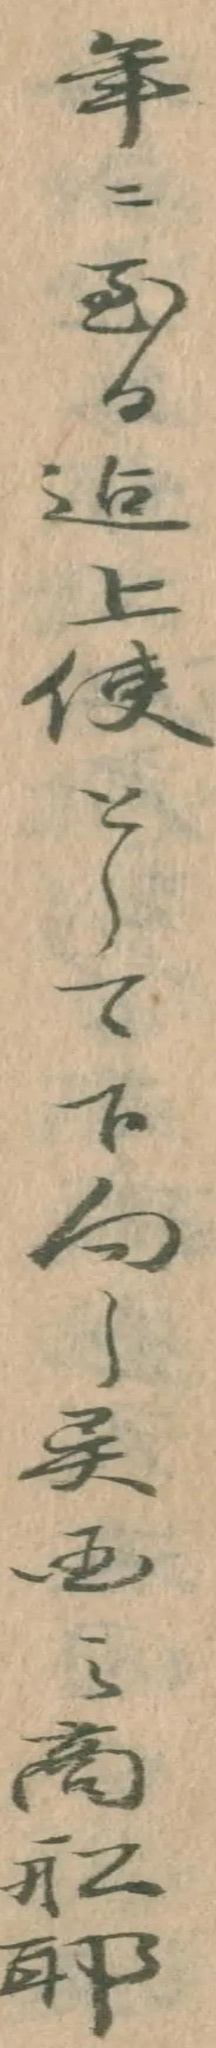年に至る迄上使として下向し異国之商船耶
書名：切支丹御退治記 49巻. [3]
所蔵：国立国会図書館 National Diet Library, JAPAN
